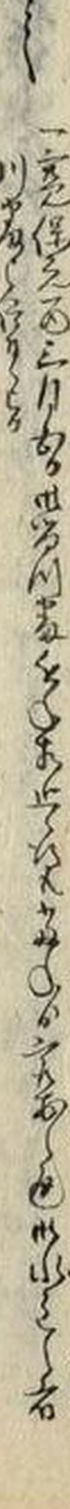一寛保元酉三月五日御留川番近年相止候得共当年ゟ最前之通御水主之者
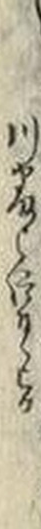川番被仰付候旨
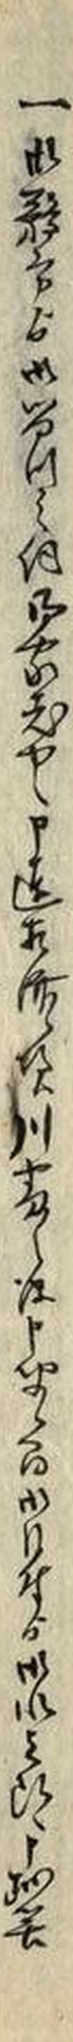一御鵜方ゟ御留川之伺御家老中へ申達相済候得ハ川番之儀申聞候間御目付ゟ御水主頭へ申越筈
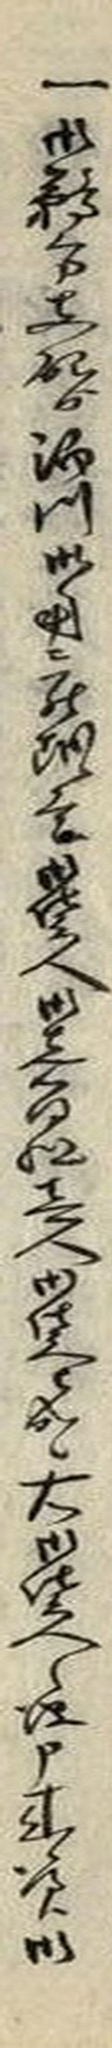一御鵜方支配ゟ溜川御用ニ罷越候節御貸人御先筒組壱人御貸被成候右御貸人之儀申来候得ハ御
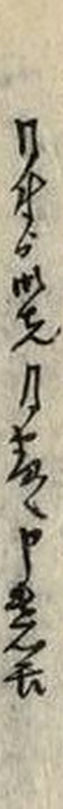目付ゟ御先月番へ申遣筈
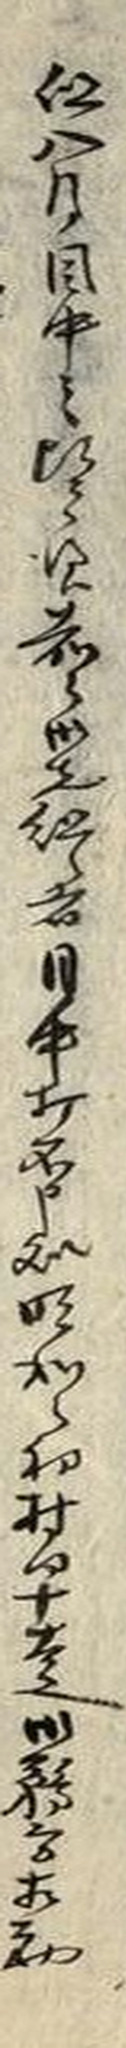但八月目中之頃ニ候得ハ前々御先組之者目中打不申処明和之初村田十太夫御鵜方相勤
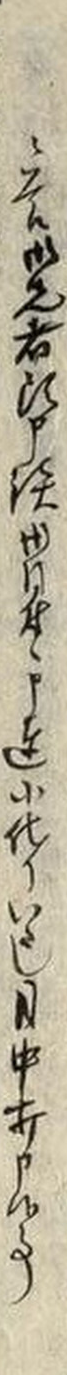候節御先者頭申談御目付へ申達小代りいたし目中打申候事
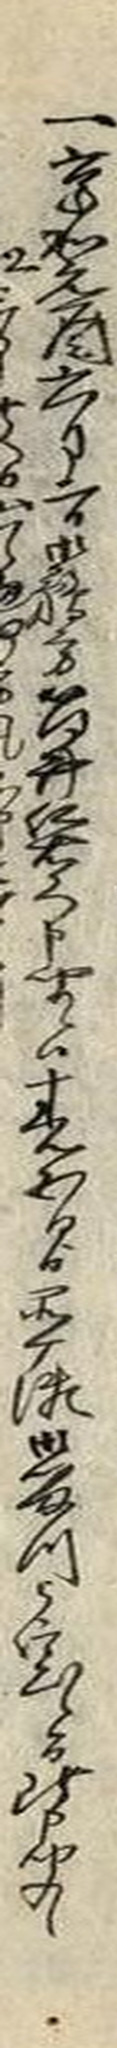一享和元酉六月二日御鵜方筒井仁右衛門申聞候ハ来ル五日ゟ品ケ淵御留川被仰出候ニ付断申聞候
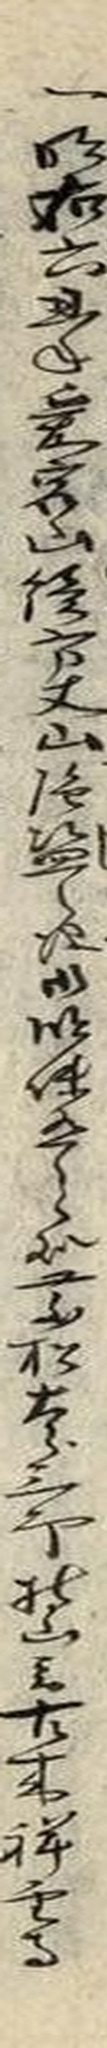一明和六丑年愛宕山続方丈山強盗之儀御吟味有之候処慶松太郎三郎持山ニ而古来祥雲寺
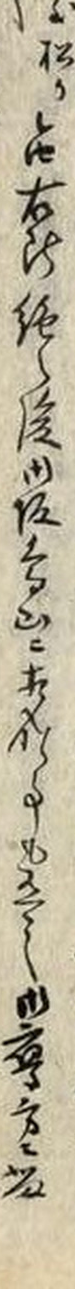墓所有之候由右断絶之後御坂鳥山ニ相成候事も有之御鷹方ニ留
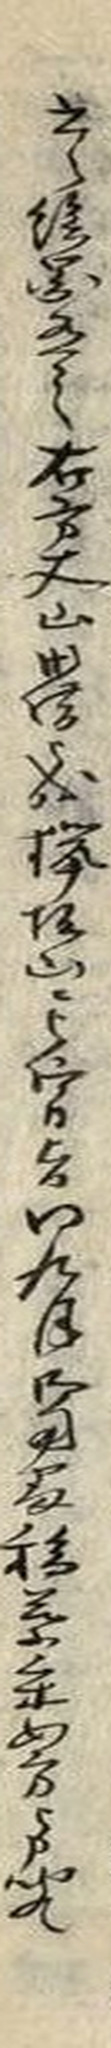之絵図有之右方丈山御借被成猟坂山ニ被仰付旨同九月御用番稲葉采女方被申聞候
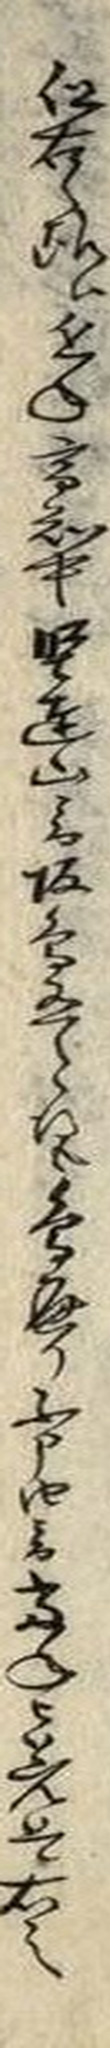但右之趣ハ近年高知中堅達山ニ而坂鳥有之候得共鳥通り不申由ニ而当年被差上候右之
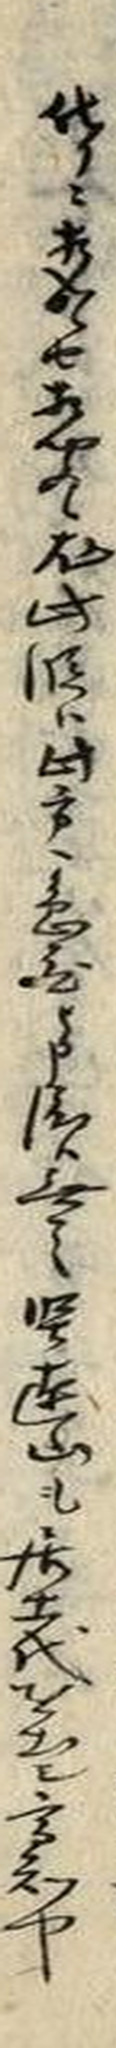代りニ相成候由相聞候尤此段ハ此方へ急度被申渡ハ無之堅達山も居土代を出シ高知中

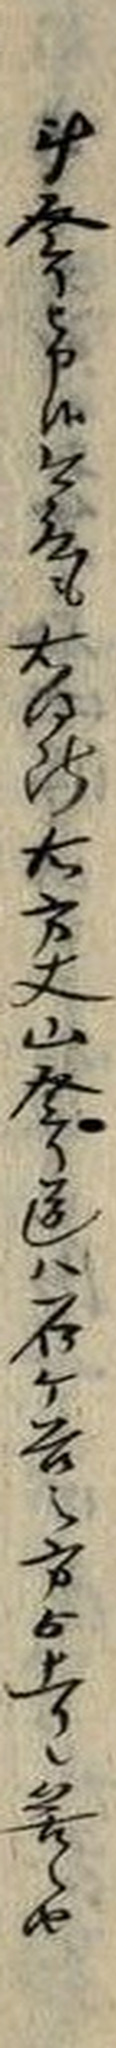斗登り被申候今度も右同断右方丈山登り道ハ石ケ谷之方ゟ上り候筈之由
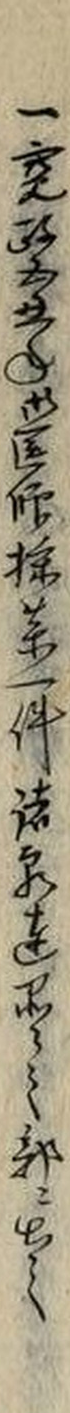一寛政五丑年御医師採薬一件諸願達品々之部ニ出之
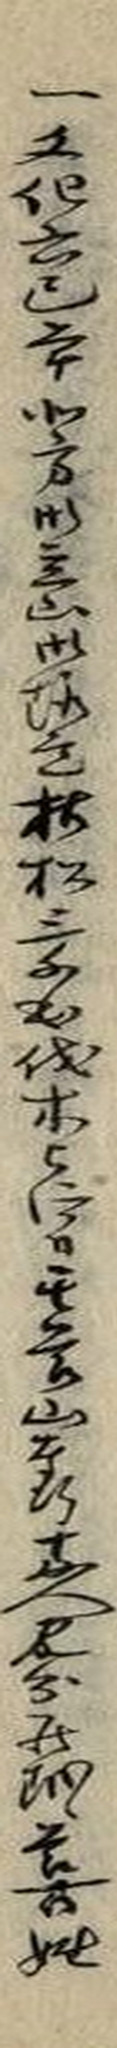一文化六巳北方御立山御趣意枯松三千本伐木被仰付其節山奉行両人見分罷越候節百姓
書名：御国他国諸事之部
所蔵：福井県文書館 Fukui Prefectural Archives
